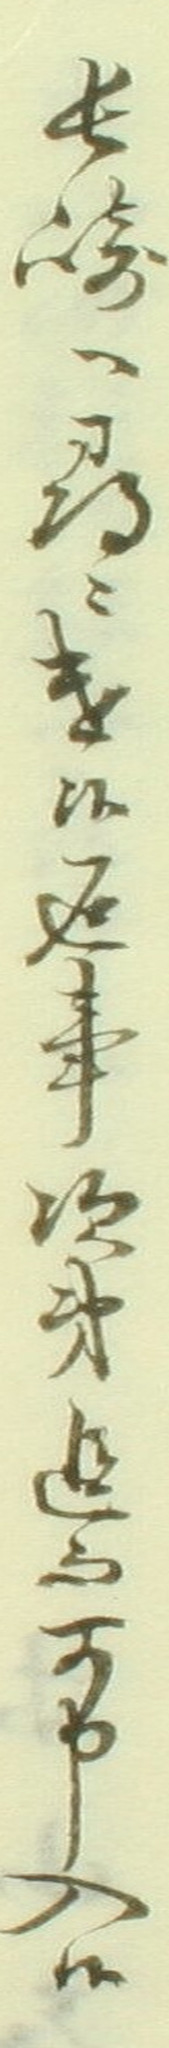長崎へ尋に遣候返事次第追而可申入候
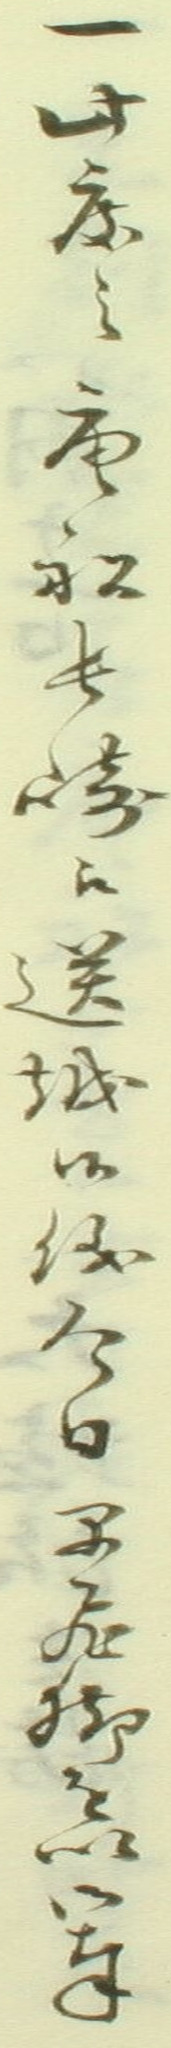一今度之唐船長崎え送越候儀今日早飛脚を以御奉
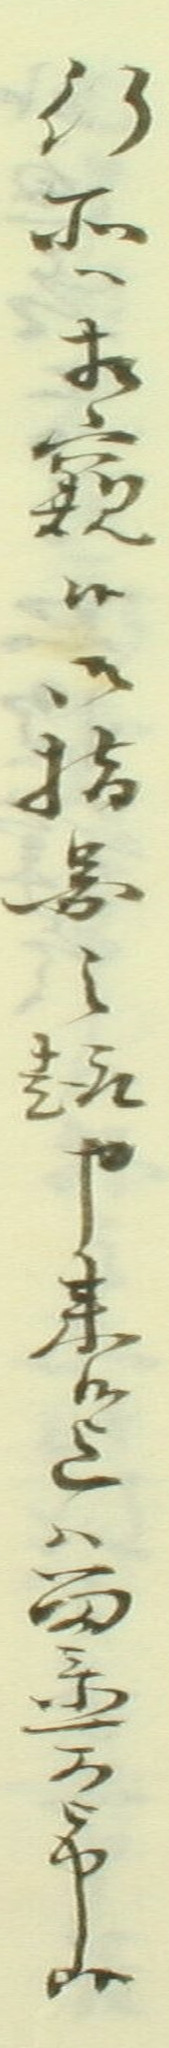行所へ相窺候御指図之趣申来候迄は留置可被申候
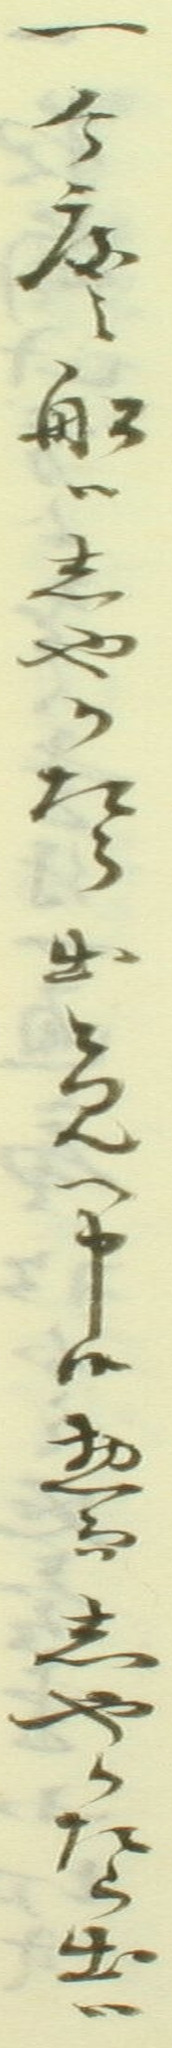一今度之船はしやかたら出と見へ申候惣而しやかたら出は
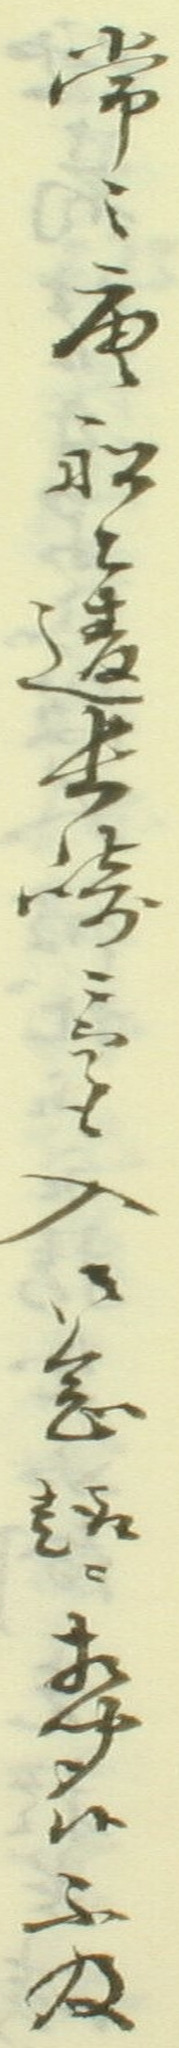常々唐船と違長崎に而も入御念趣に相聞候不及
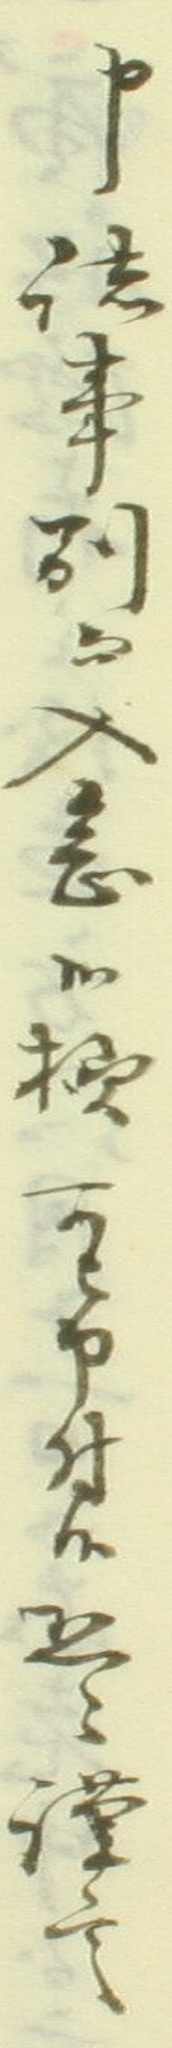申候諸事別而入念候様可被申候恐々謹言
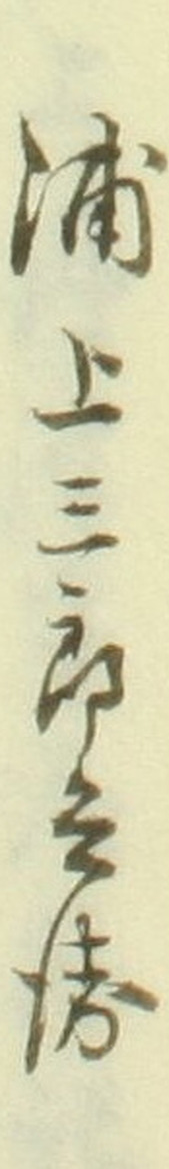浦上三郎兵衛
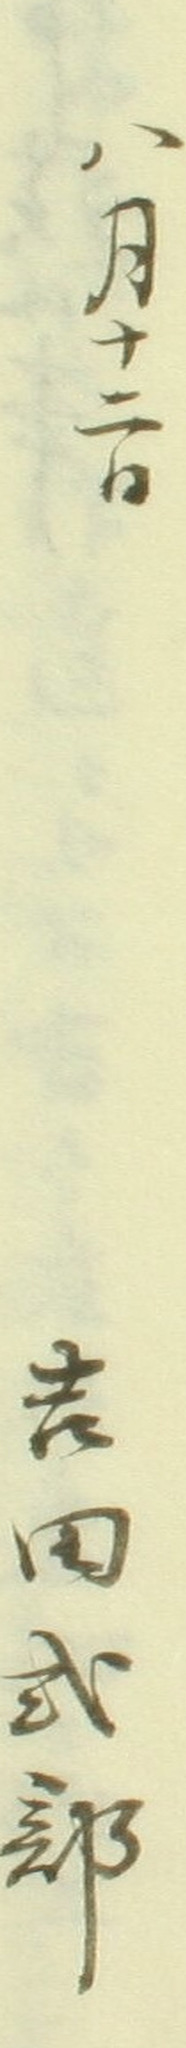八月十二日吉田式部
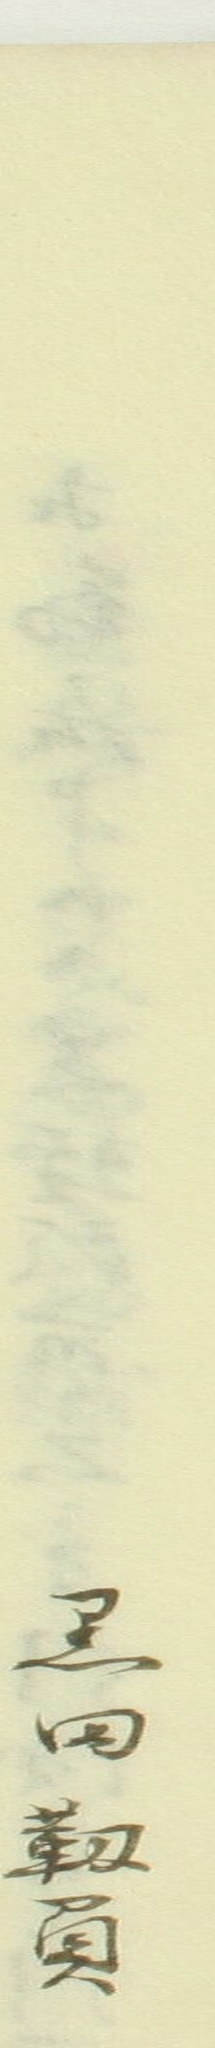黒田靭負
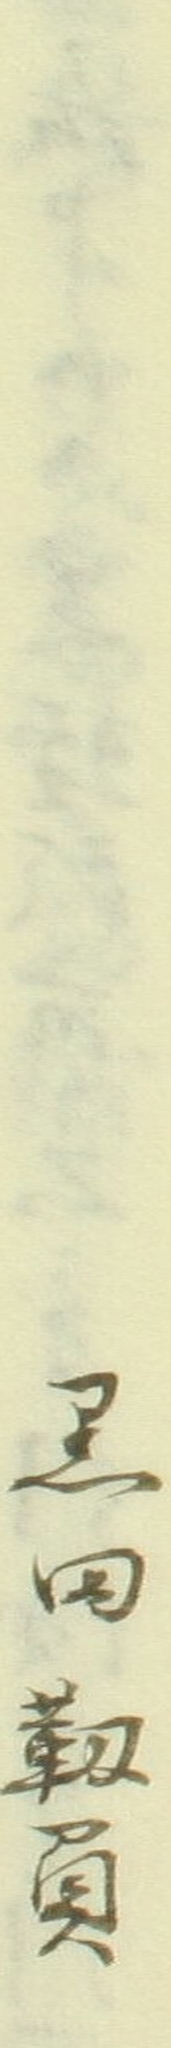黒田靭負
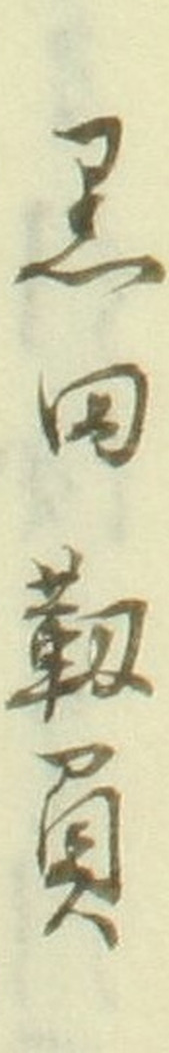黒田靭負
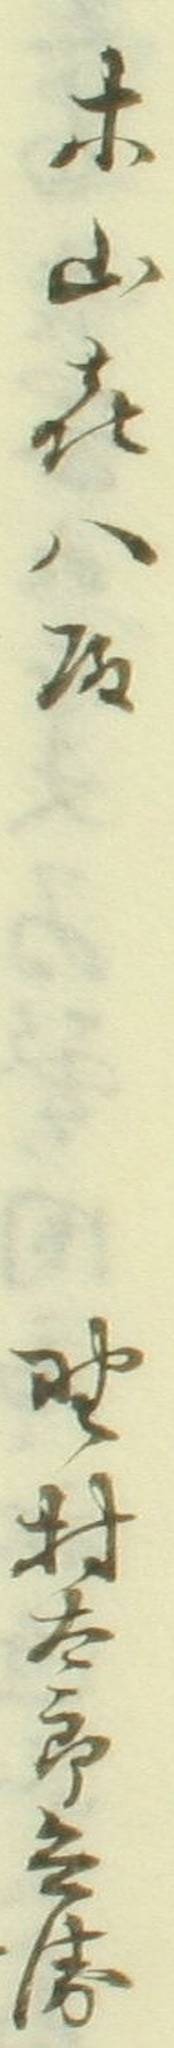木山喜八殿野村太郎兵衛
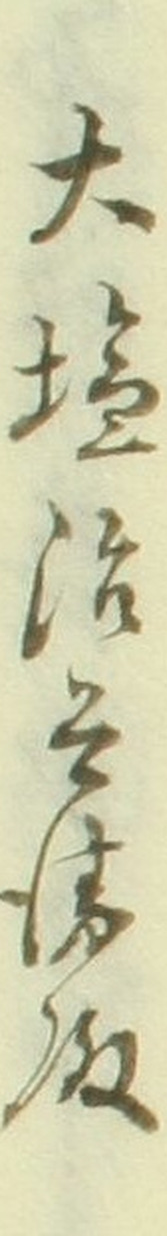大塩治兵衛殿
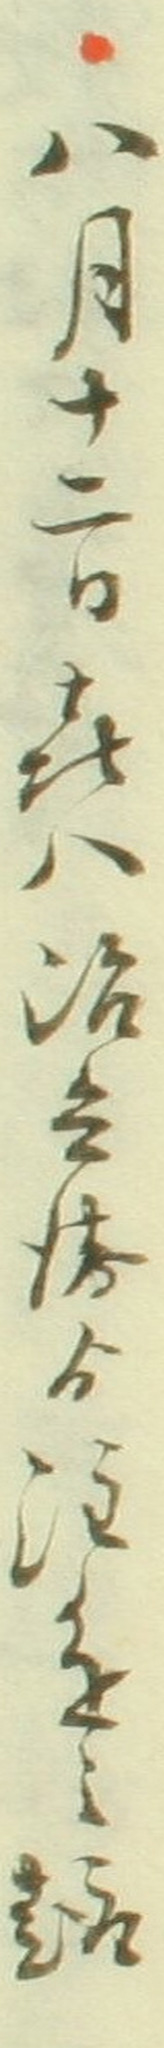八月十二日喜八治兵衛ゟ注進之趣
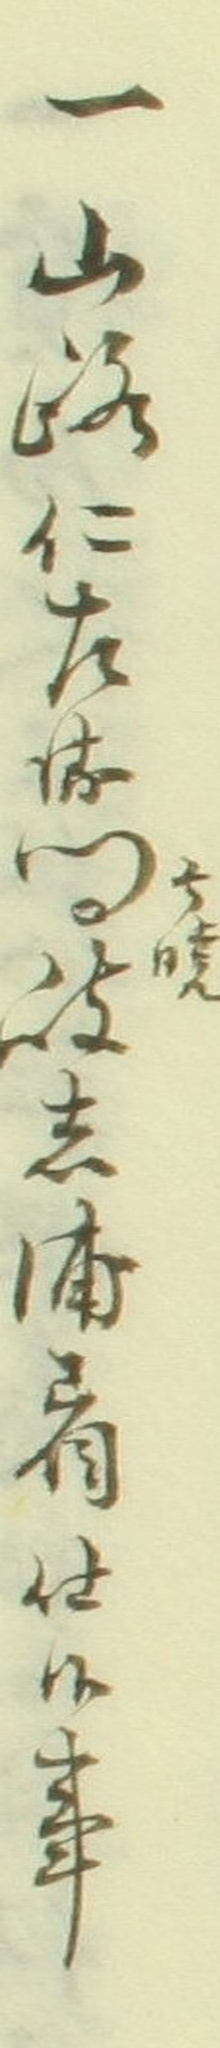一山路仁左衛門◦岐志浦着仕候事
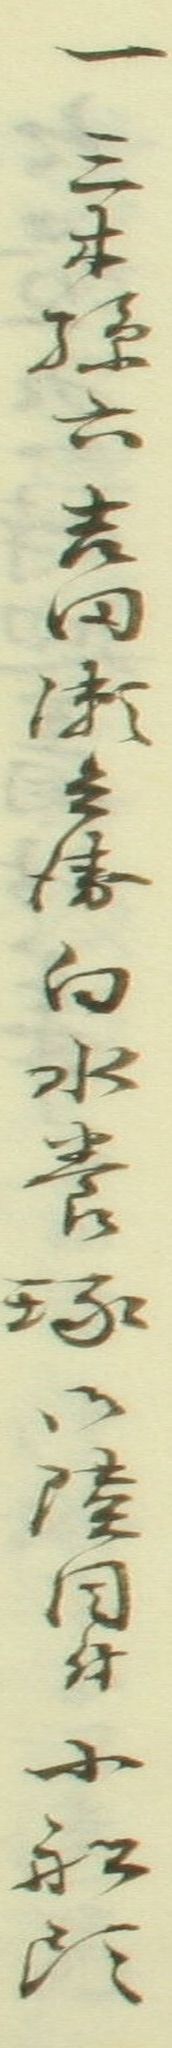一三木孫六吉田瀬兵衛白水琢御陸目付小船頭
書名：異国船漂着記
